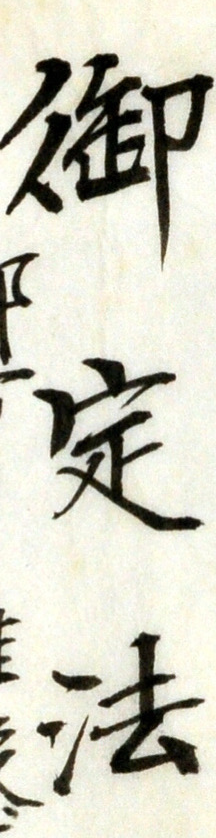御定法
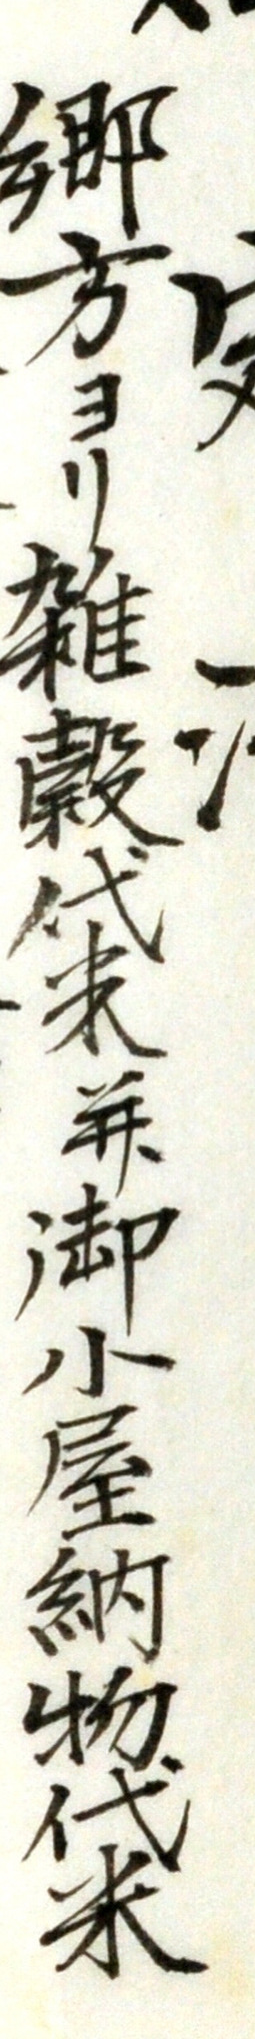郷方ヨリ雑穀代米并御小屋納物代米
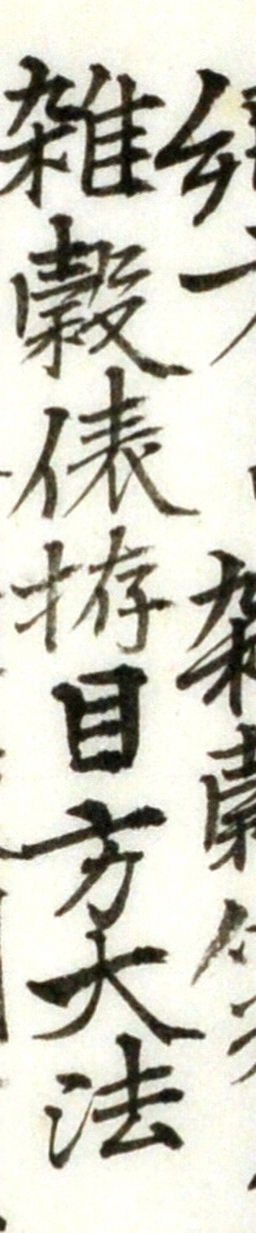雑穀俵拵目方大法
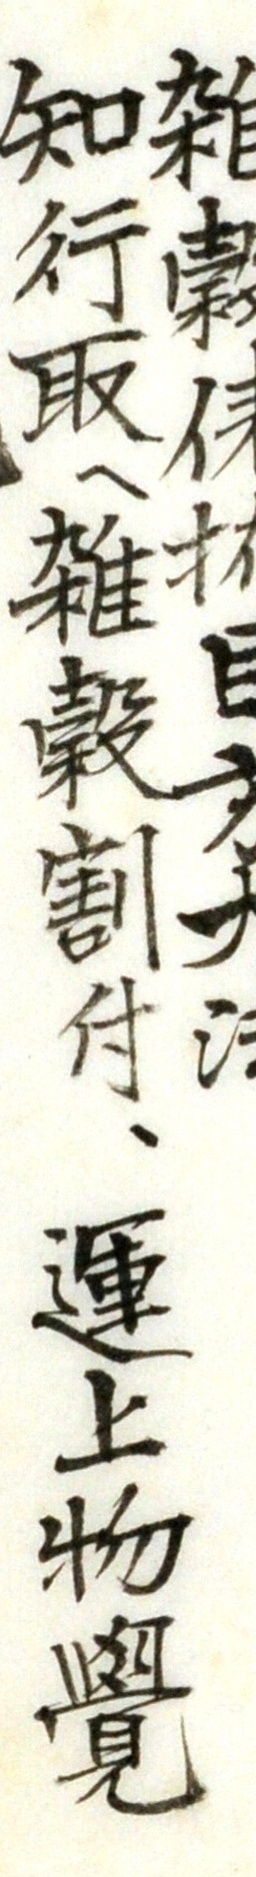知行取へ雑穀割付、運上物覚

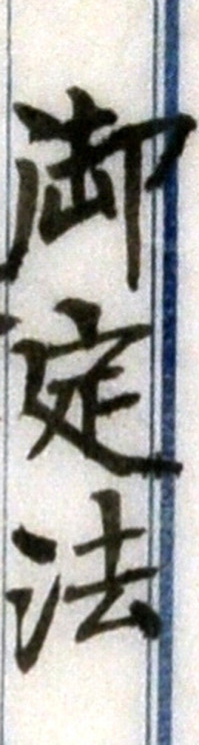御定法
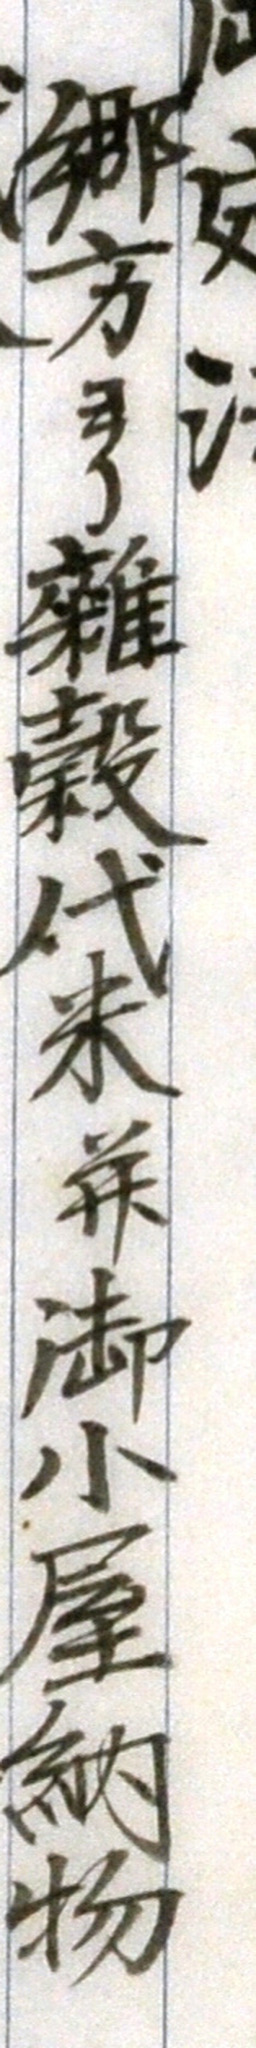郷方ヨリ雑穀代米并御小屋納物
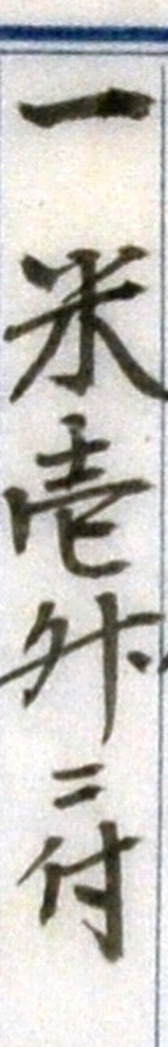一米壱升ニ付
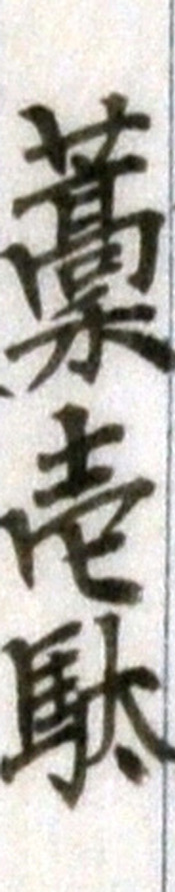藁壱駄
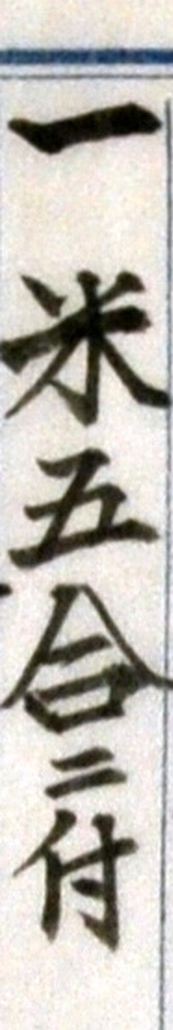一米五合ニ付
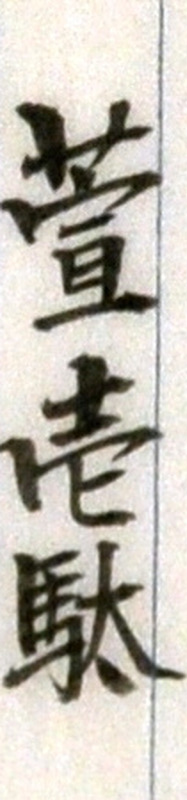藁壱駄

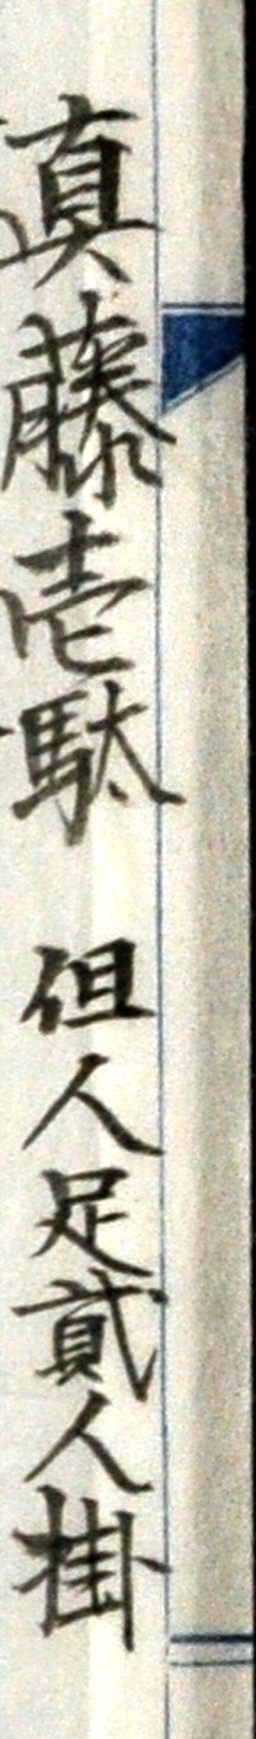真藤壱駄但人足弐人掛
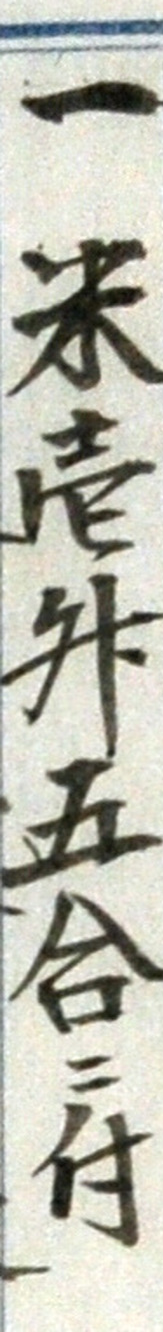一米壱升五合ニ付
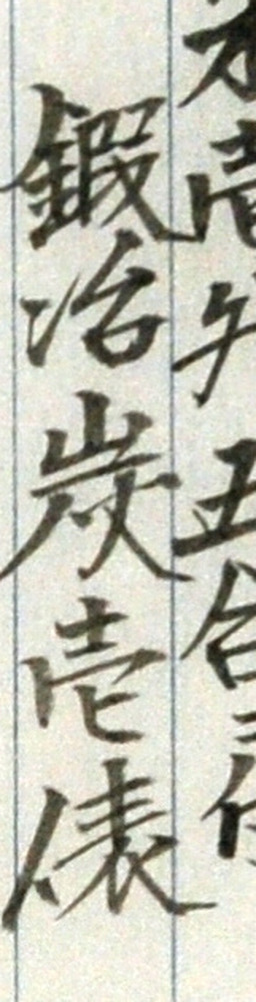鍛冶炭壱駄
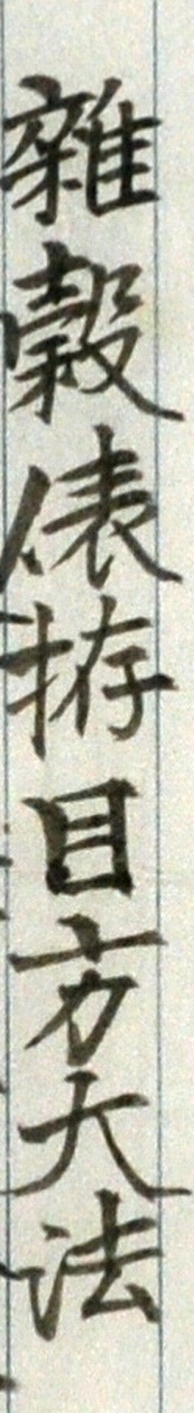雑穀俵拵目方大法
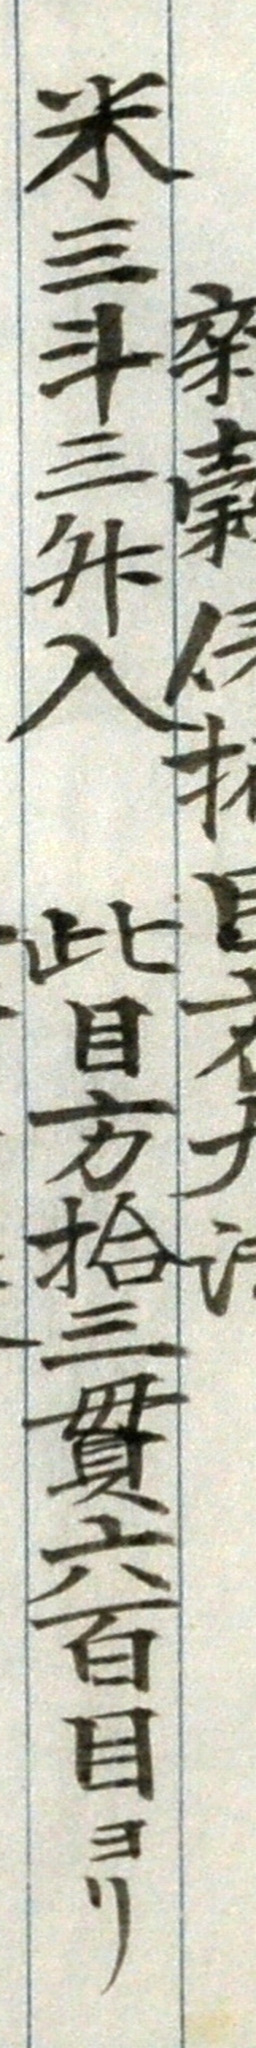一米三斗三升入此目方拾三貫六百目ヨリ
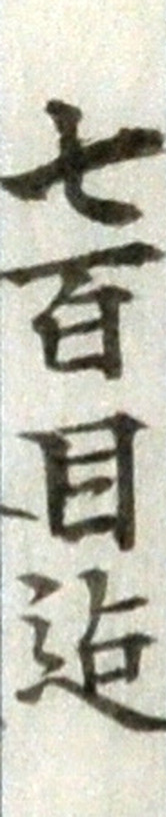七百目迄
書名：御定法
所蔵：伊那市立高遠町図書館・合同会社AMANE
